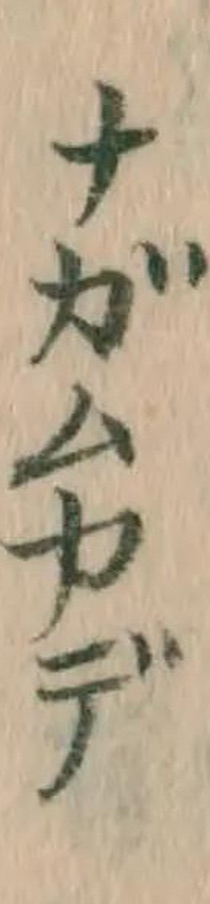ナガムカデ
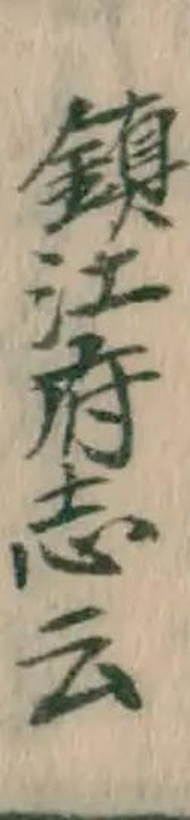鎮江府志云
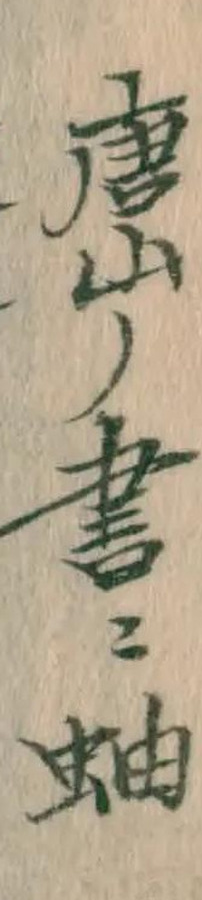唐山ノ書ニ蚰
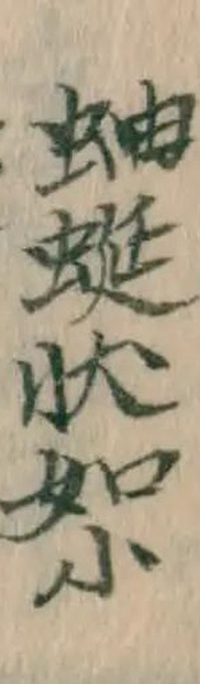蚰蜒状如小
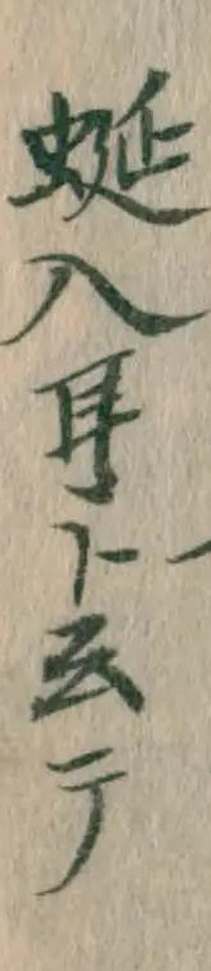蜒入耳ト云テ
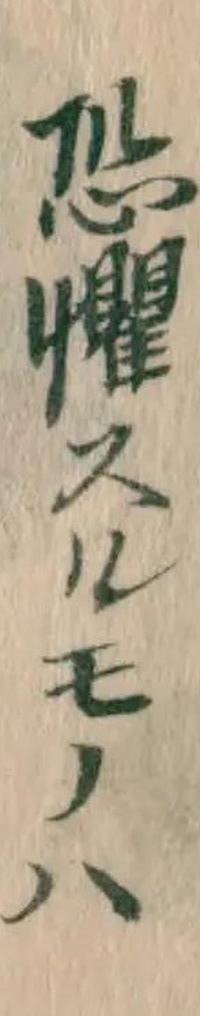恐懼スルモノハ
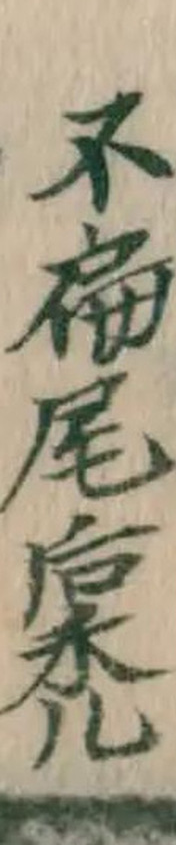不扁尾后禿
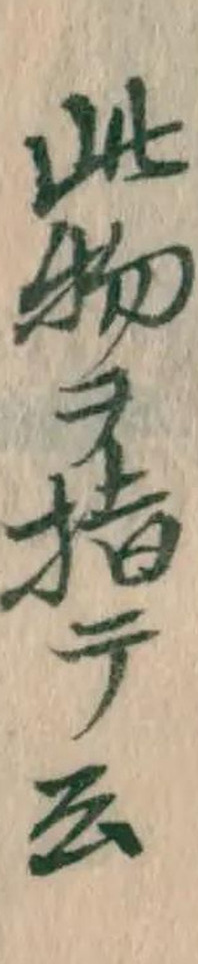此物ヲ指テ云
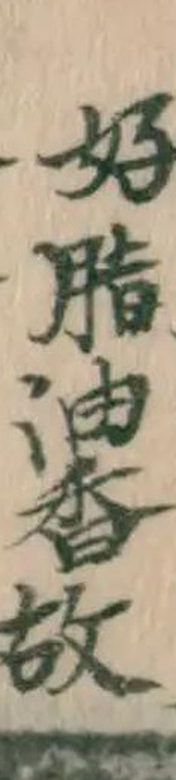好脂油香故
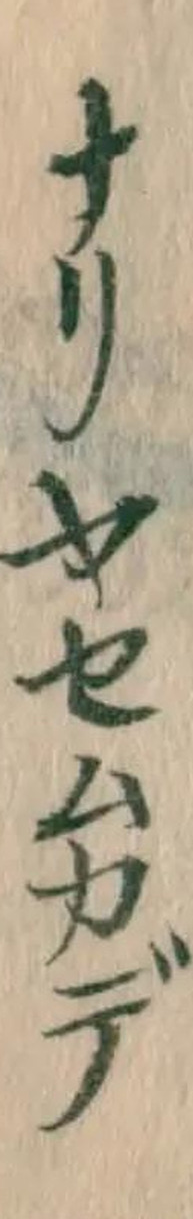ナリヤセムカデ
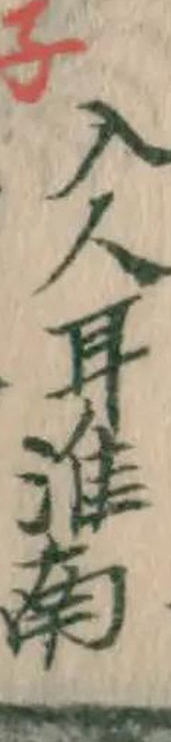入人耳淮南
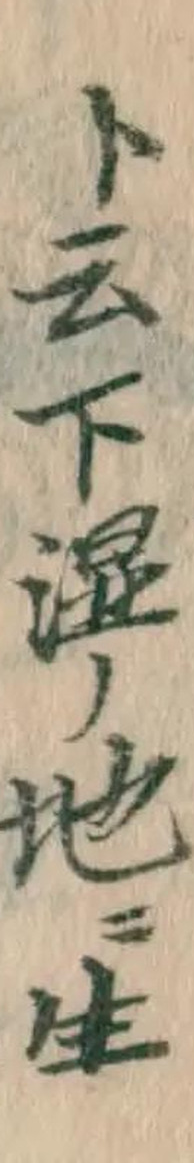ト云下湿ノ地ニ生
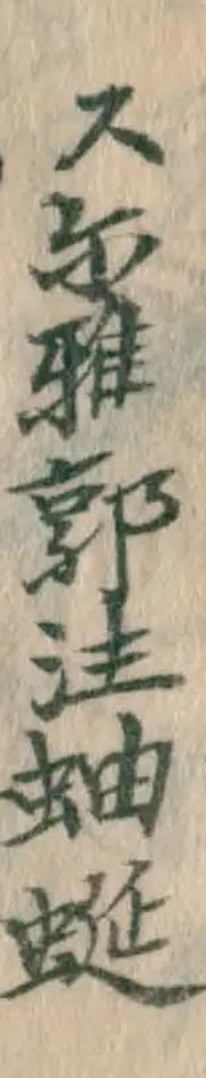ス尓雅郭注蚰蜒
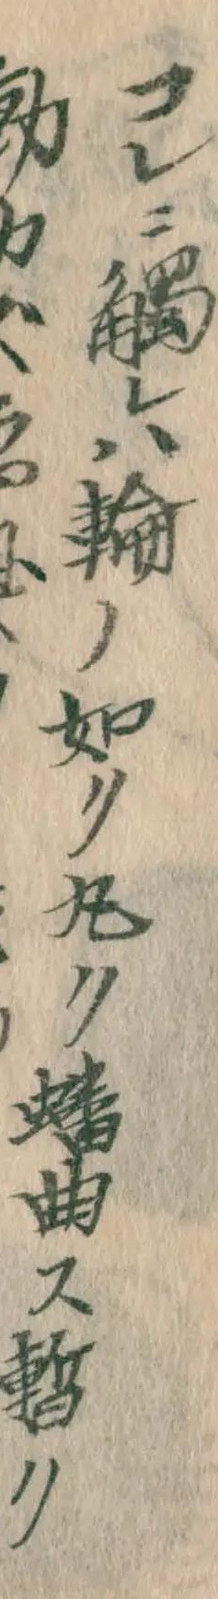コレニ觸レハ輪ノ如ク丸ク蟠曲ス暫ク
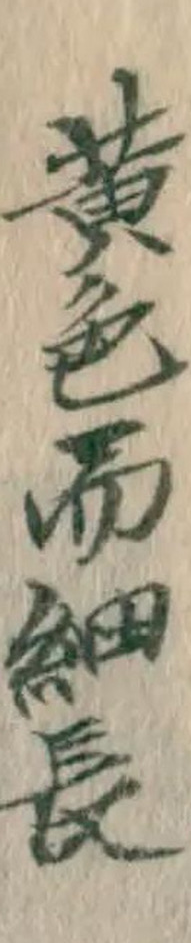黄色而細長
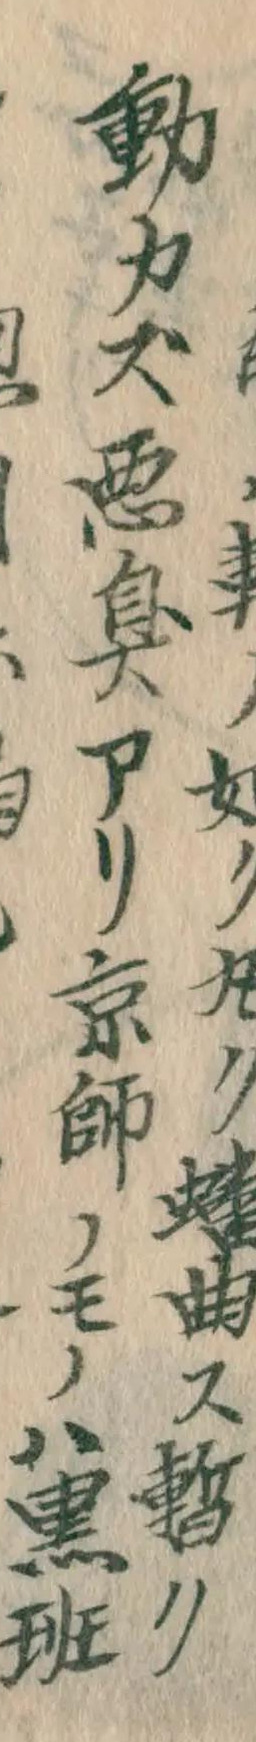動カズ悪臭アリ京師ノモノハ黒班
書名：千蟲譜 3巻. [1]
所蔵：国立国会図書館 National Diet Library, JAPAN
